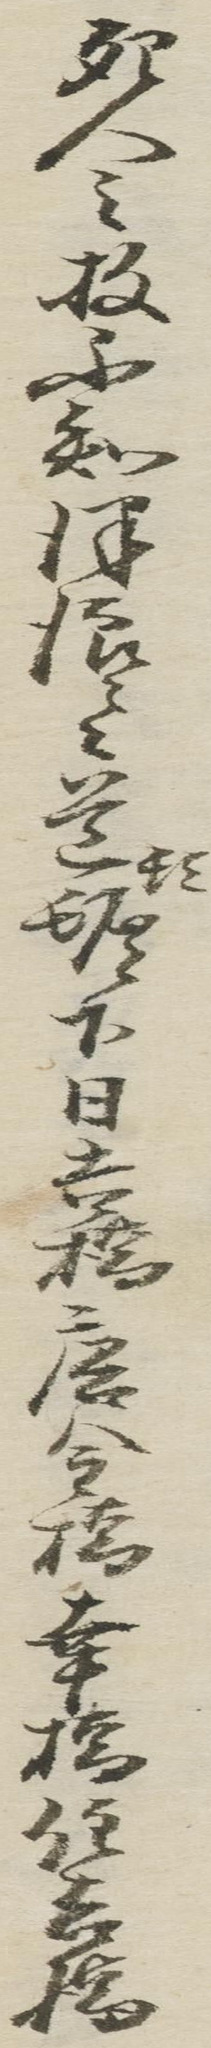死人之数不知津浪ニて道頓堀下日吉橋唐金橋住吉橋幸橋

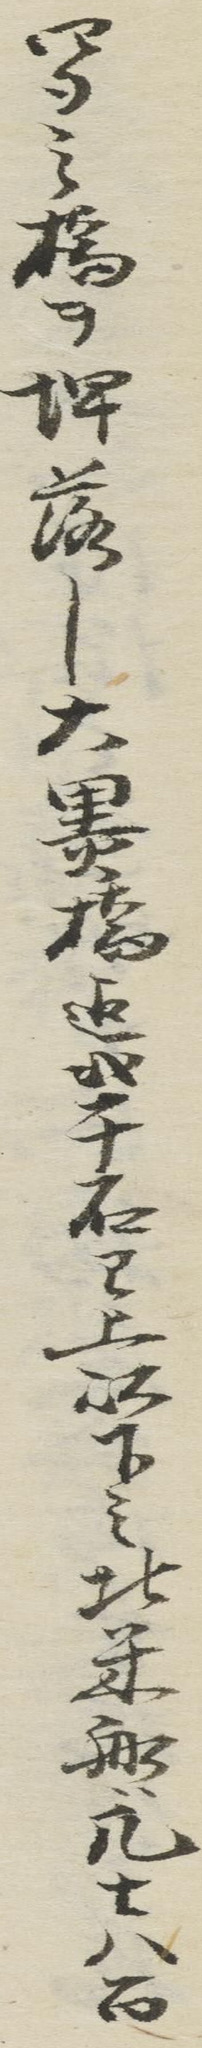四ツ之橋ヲ押落し大黒橋迄弐千石已上以下の北米船ハ凡七八百
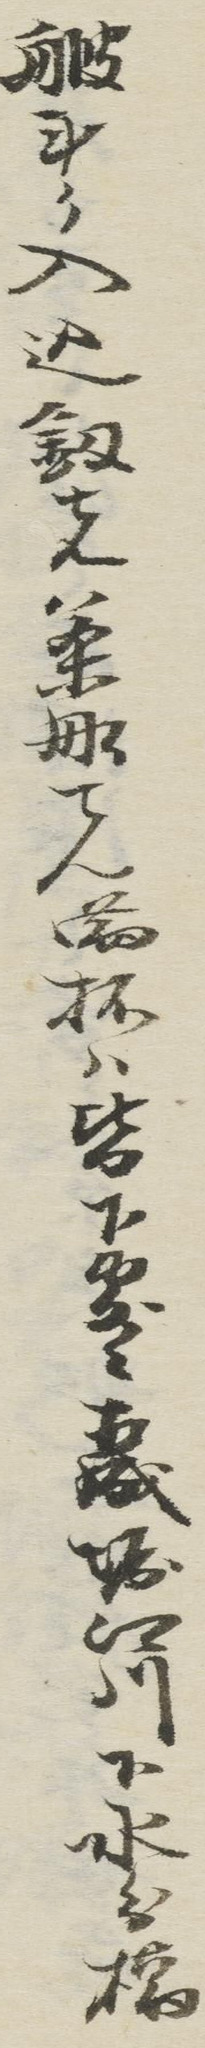艘斗り入込釼先茶船てんま抔ハ皆下処ニ相成堀江川下水分橋
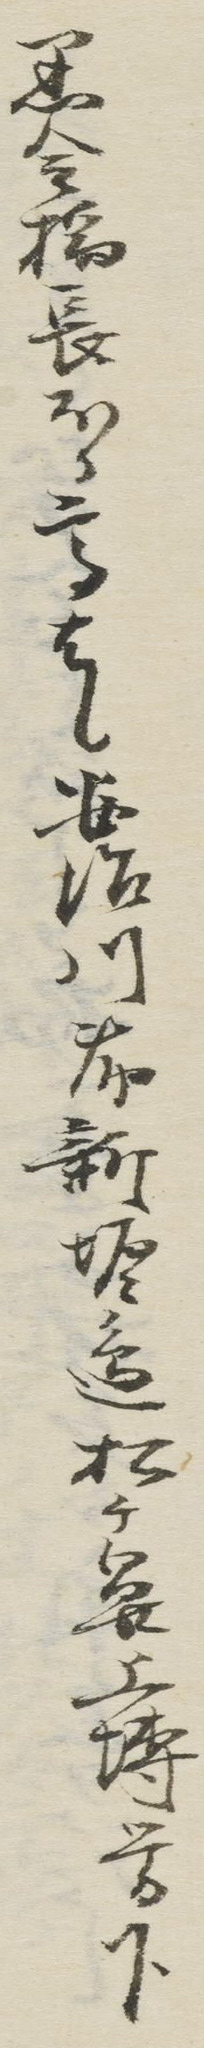黒金橋長ほり高はし安治川筋新堀辺松ヶ鼻上博労下
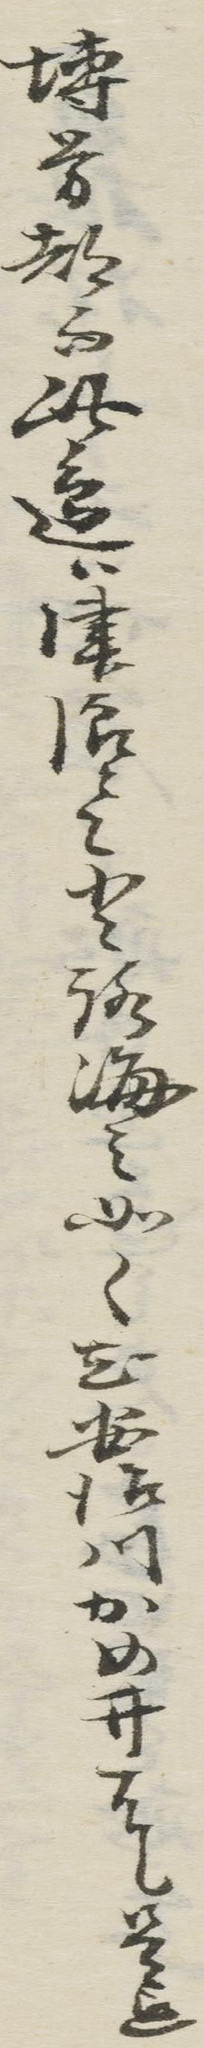博労都而此辺ハ津浪ニてとろ海之如く尤安治川かめ井はし是迄
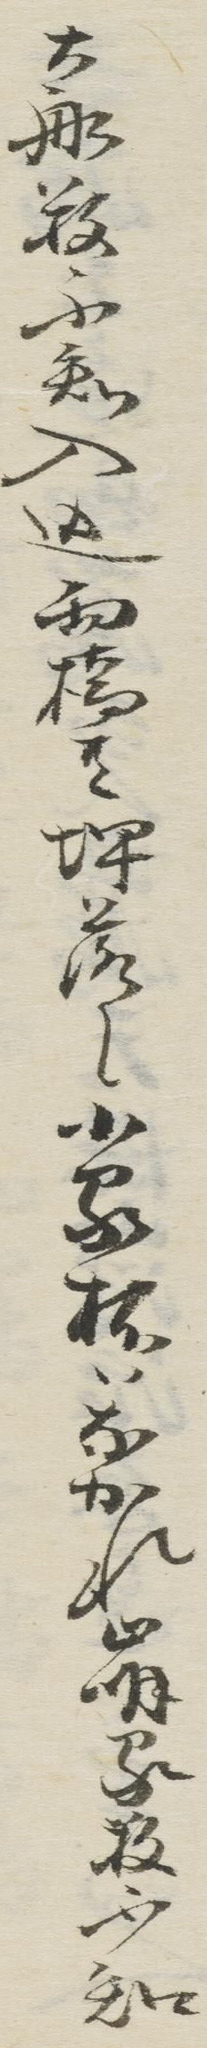大船数不知入込両橋共押落し小家抔ハなかれ崩家数不知
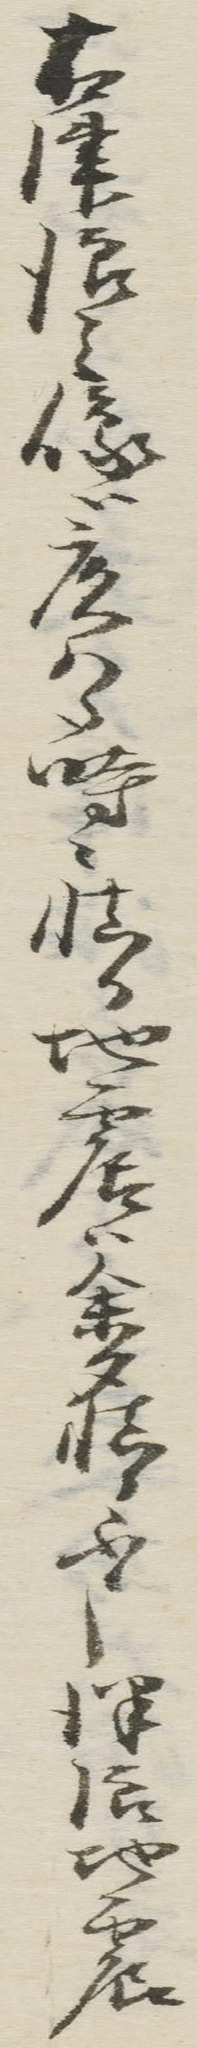右津浪之儀ハ夜八ツ時ニ慎り地震ハ余タ慎り不申津浪地震
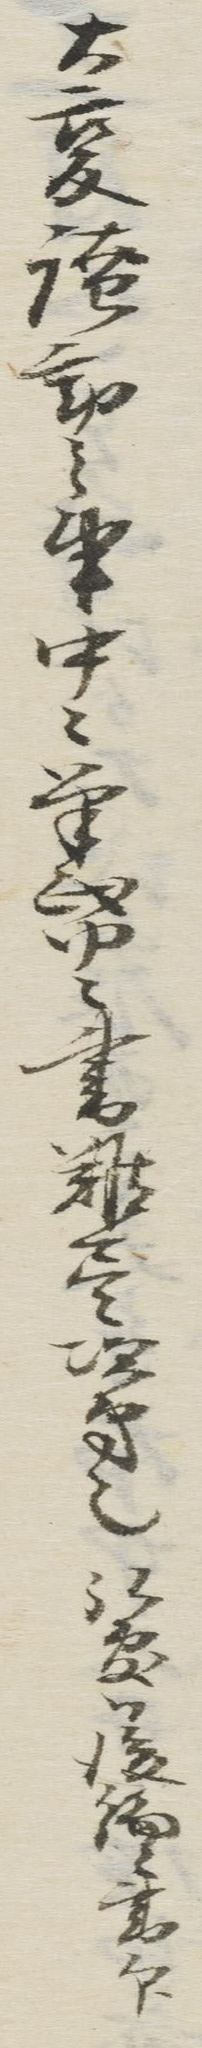大変騒動之事中々筆紙ニ書難尽次第也弘敷ハ後編ニ書印
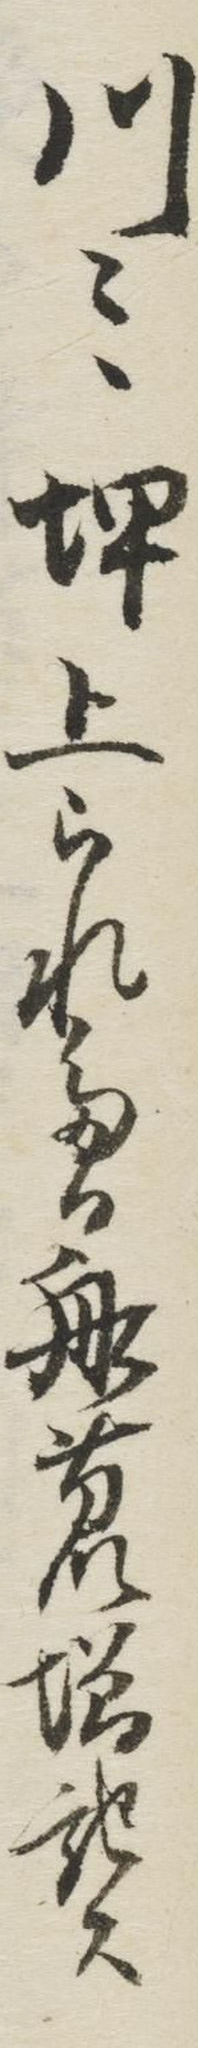川々ヘ押上られたる船荒増記ス
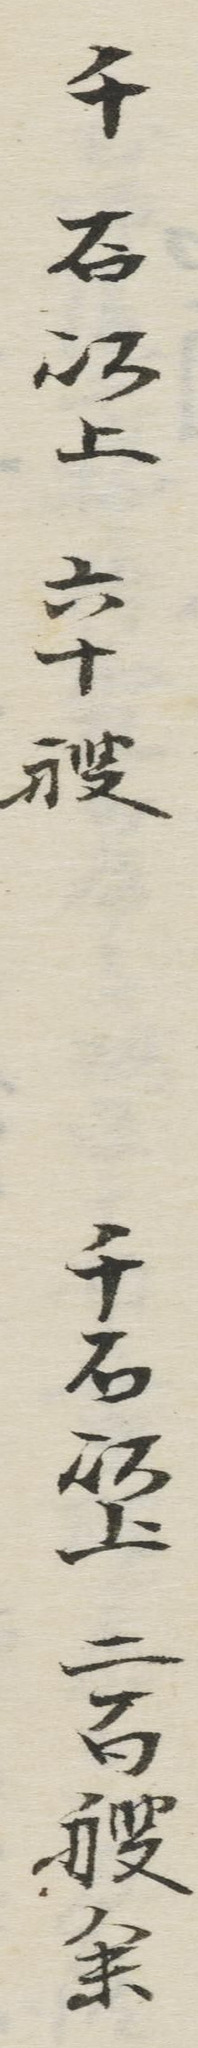千石以上六十艘千石以上二百艘余
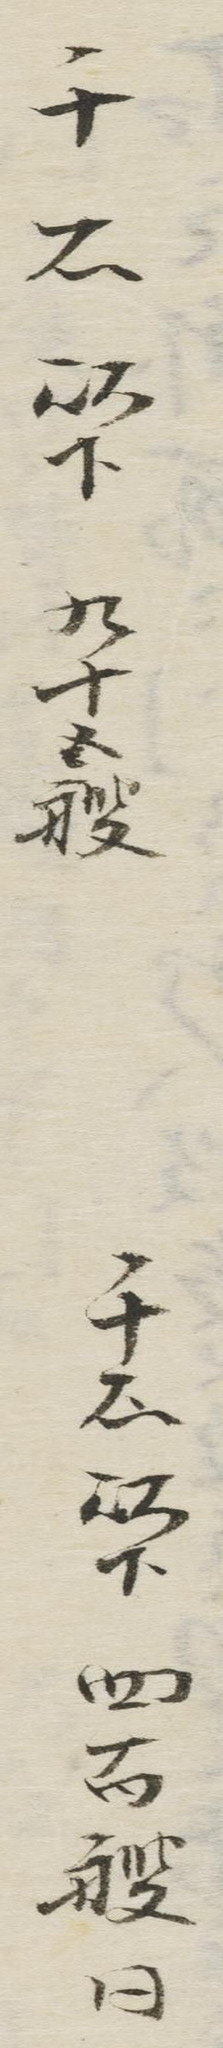千石以下九十五艘千石以下四百艘同
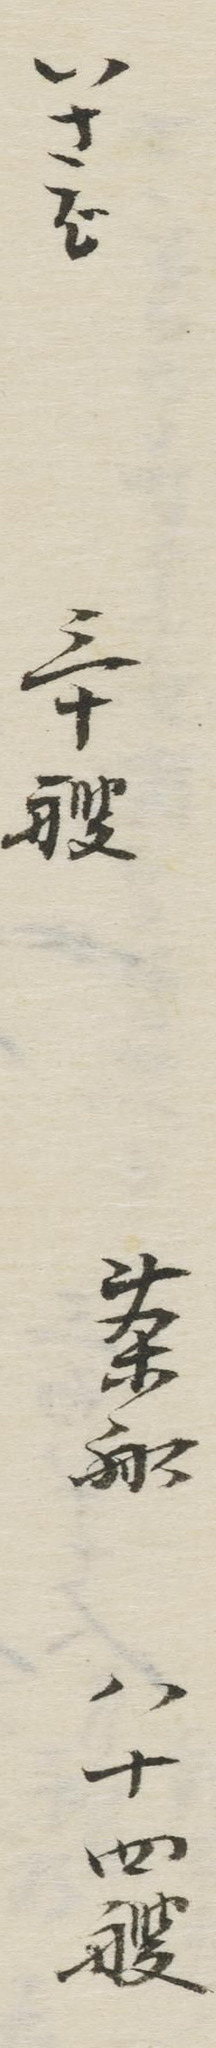いさば三十艘茶船八十四艘
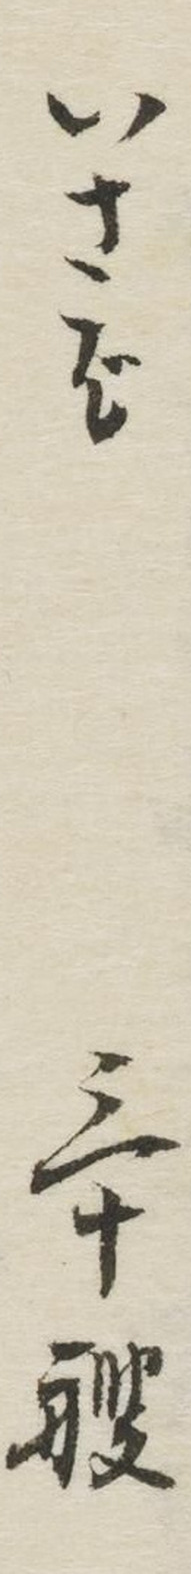いさば五十艘
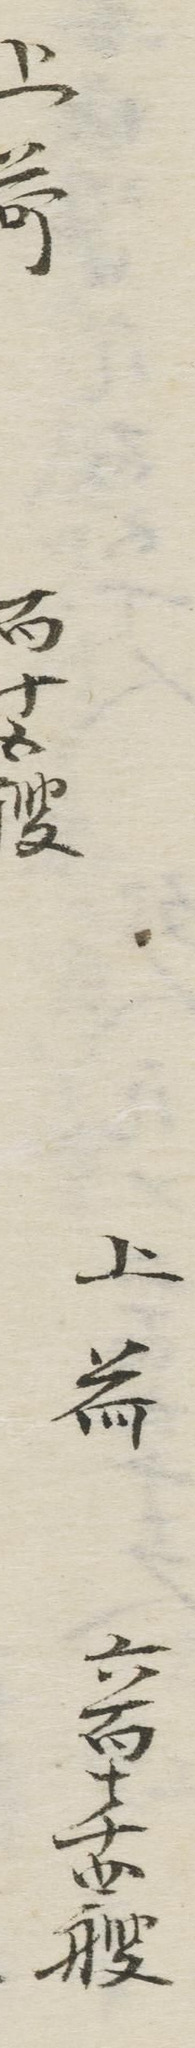上荷百十五艘上荷六百七十四艘
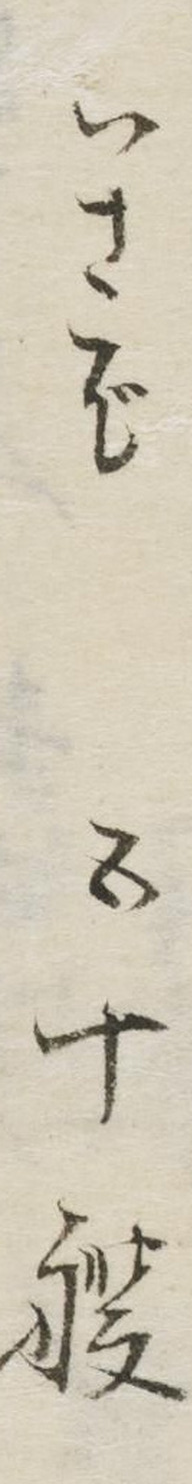いさば五十艘
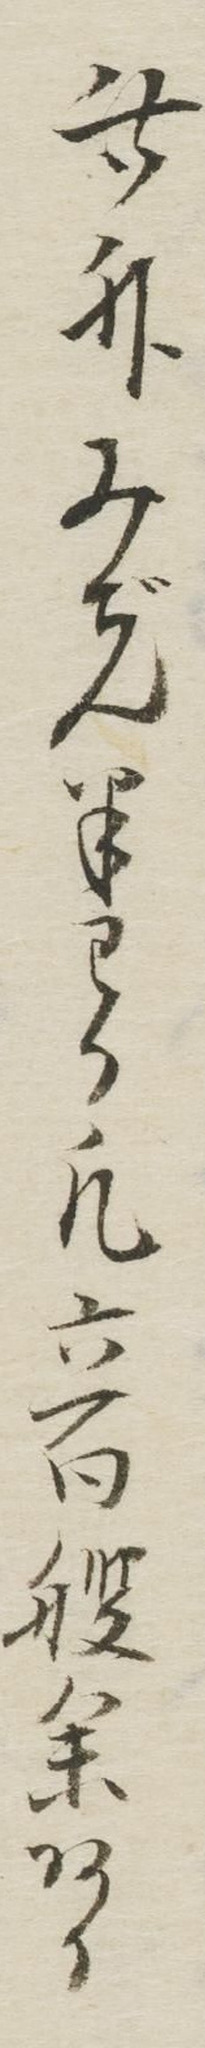此外みぢん半わり凡六百艘余あり
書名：諸国大地震大津波一代記
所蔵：東京大学地震研究所図書室 Earthquake Research Institute Library, The University of Tokyo, JAPAN
